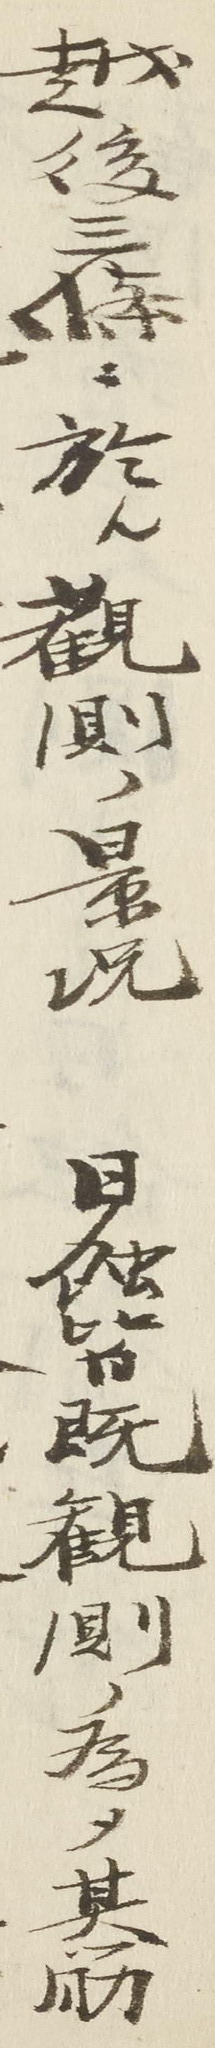越後三條ニ於ル観測ノ景況日蝕皆既観測ノ為メ其筋
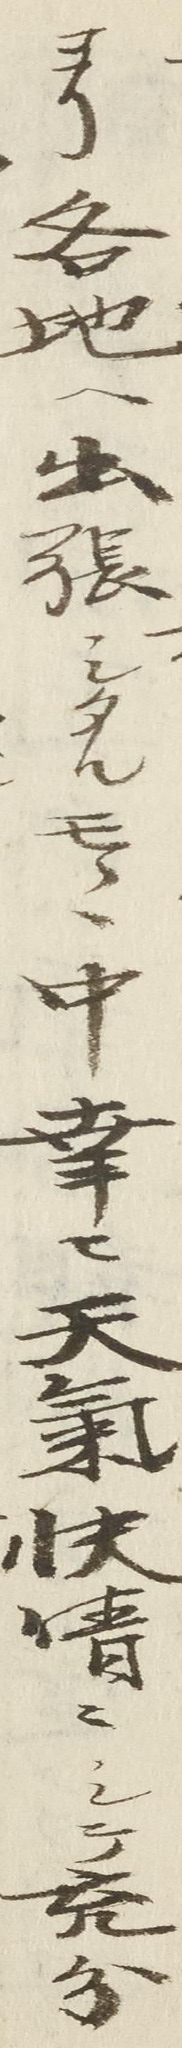ヨリ各地ヘ出張シタルモノヽ中幸モ天気快晴ニシテ充分
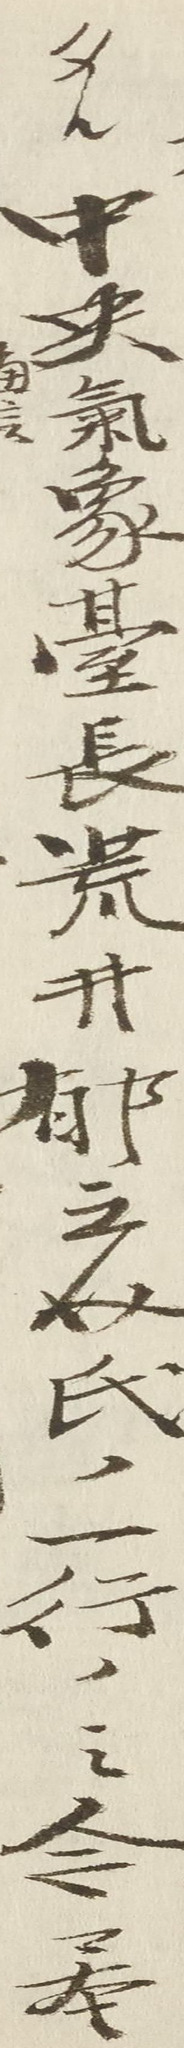タル中央気象台長荒井郁之介氏ノ一行ノミ今マ本
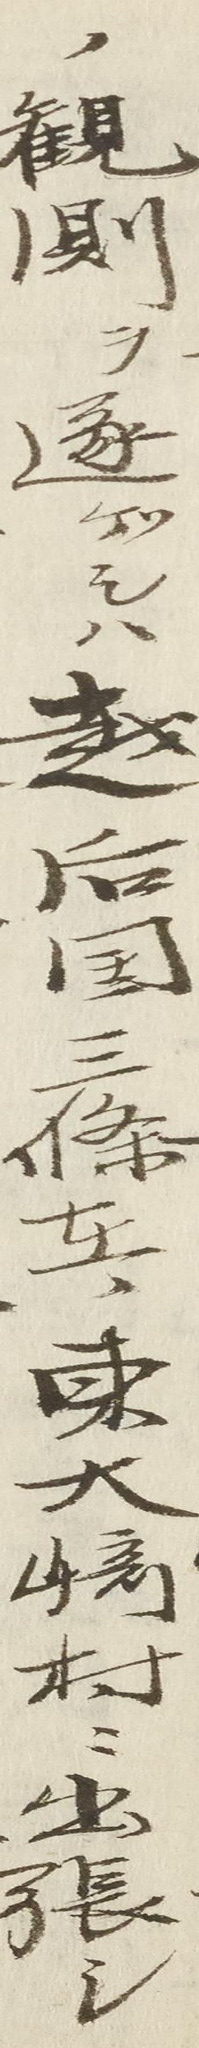ノ観測ヲ遂ゲシハ越后国三條在ノ東大崎村二出張シ
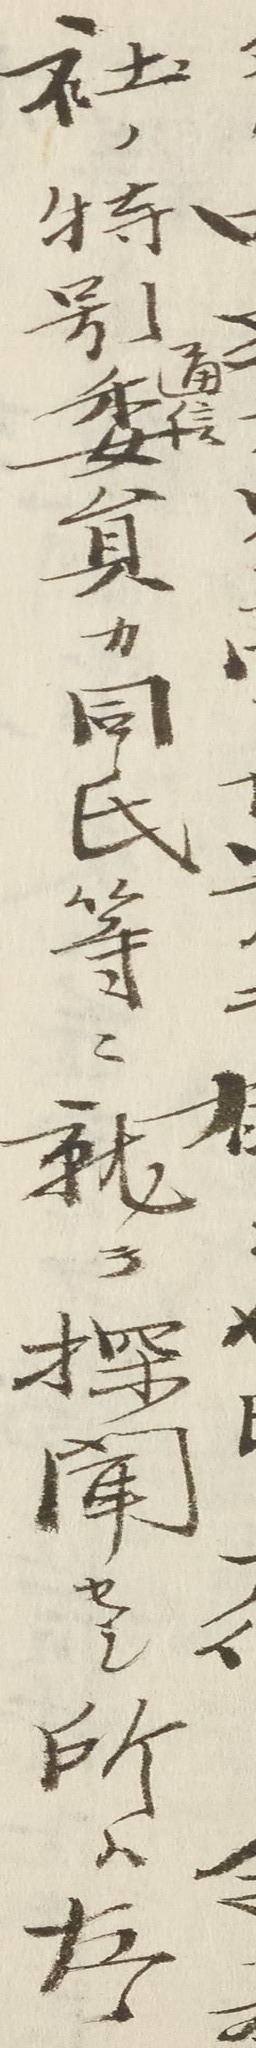社ノ特別通信委員カ同氏等ニ就ヲ探聞セシ所ハ左ノ
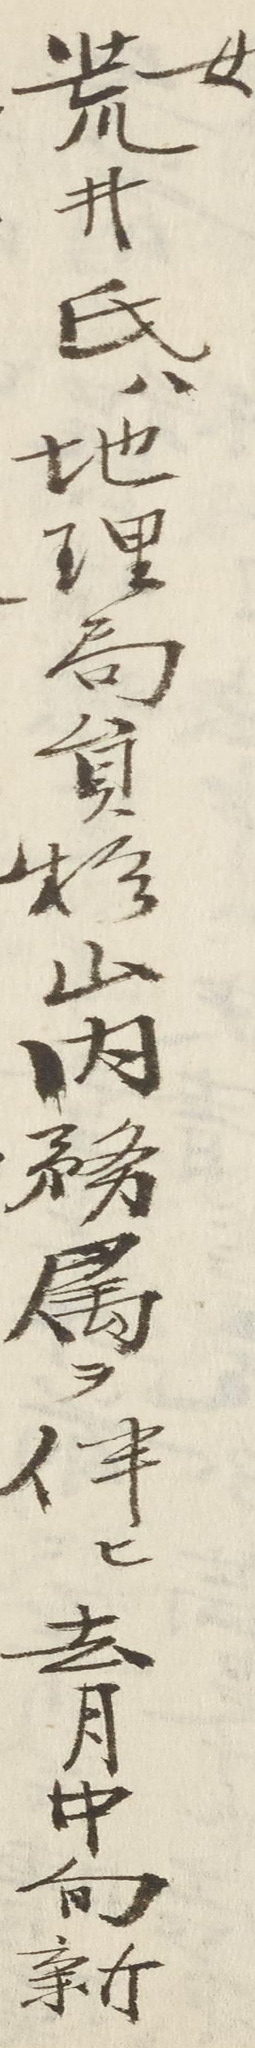荒井氏ハ地理局員杉山内務属ヲ伴ヒ去月中旬新
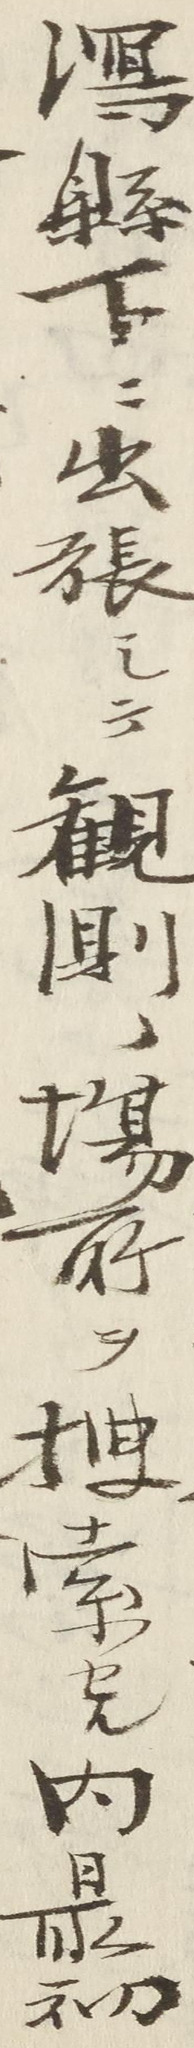潟県下ニ出張シテ観測ノ場所ヲ捜索セル内最初
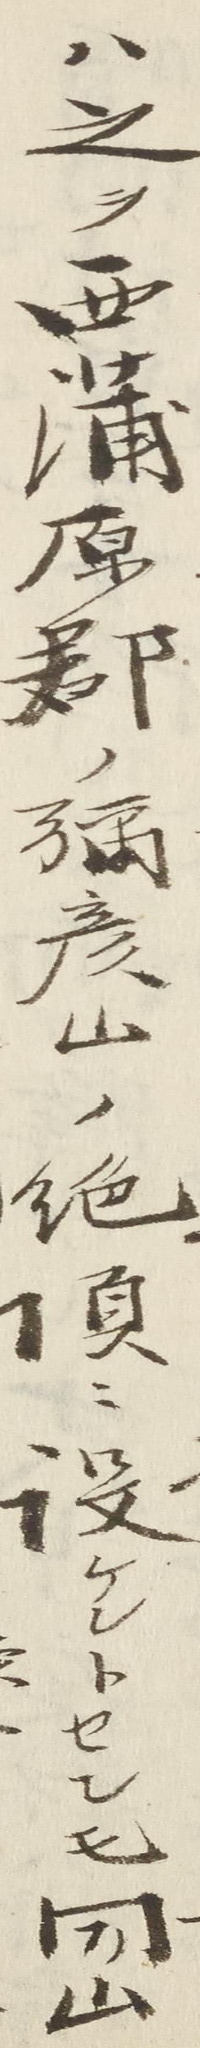ハ之ヲ西蒲原郡ノ弥彦山ノ絶頂ニ設ケントセシモ同山
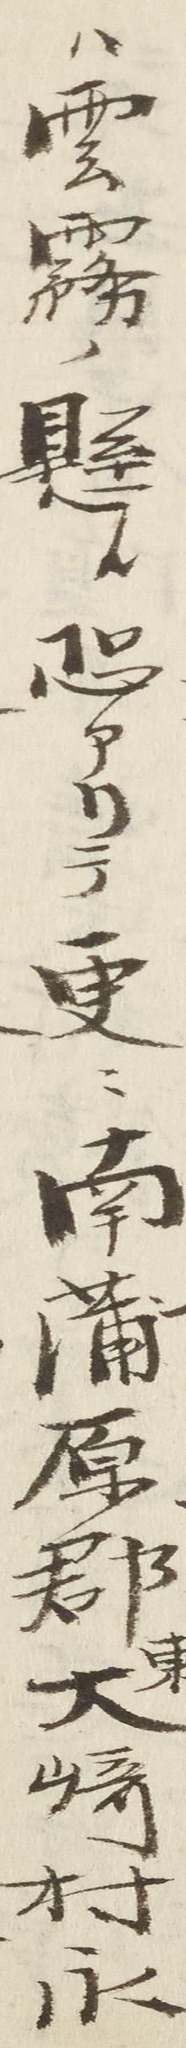ハ雲霧ノ懸ル恐アリテ更ニ南蒲原軍東大崎村永
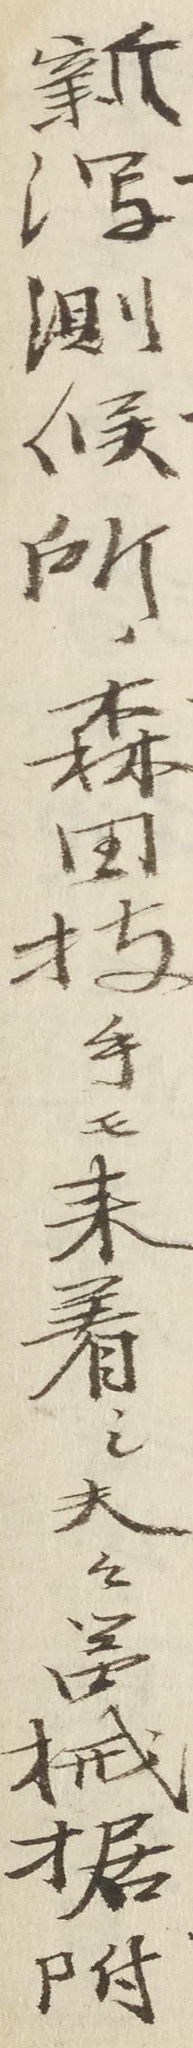新潟観測所ノ森田技手モ来着シ夫々器械据附
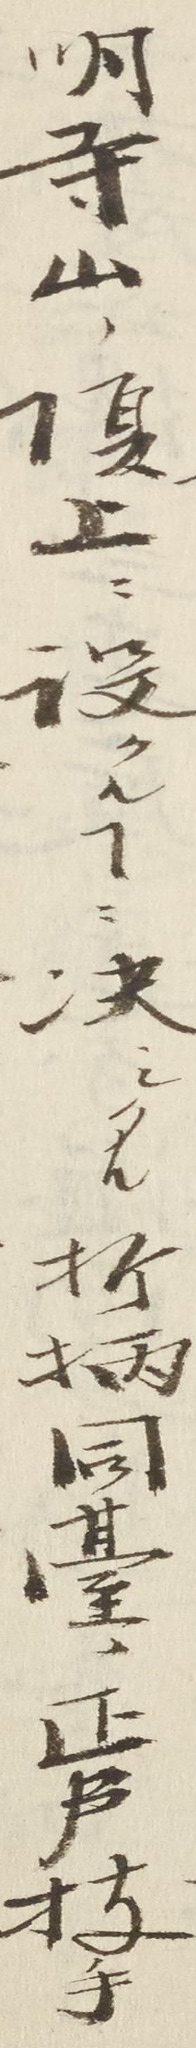明寺山ノ頂上ニ設クルコトニ決シタル折柄同台ノ正戸技手

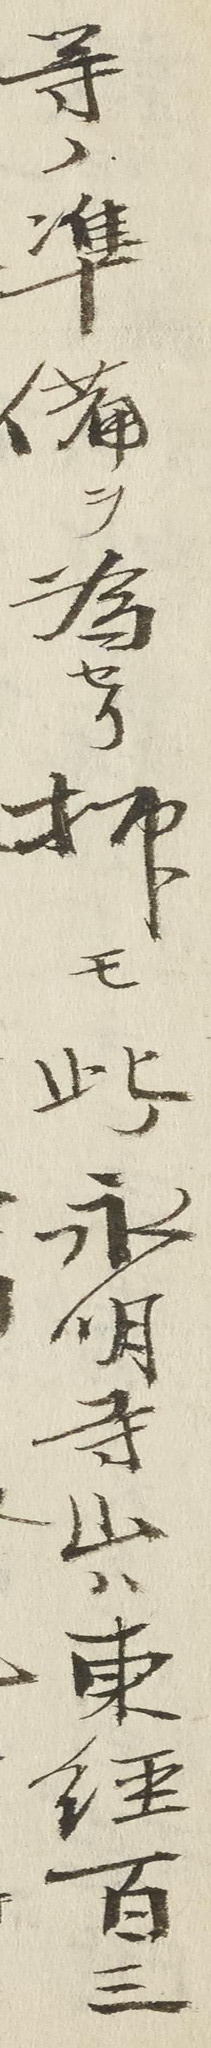等ノ準備ヲ為セリ抑モ此ノ永明寺ハ東経百三
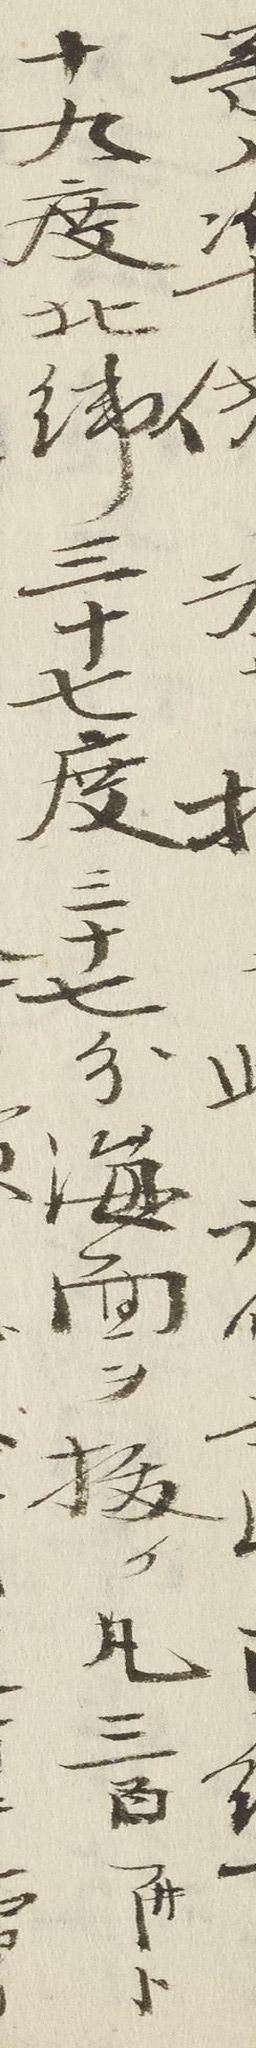十九度北緯三十七度三十七分海面ヲ抜ク凡三百フ井ート
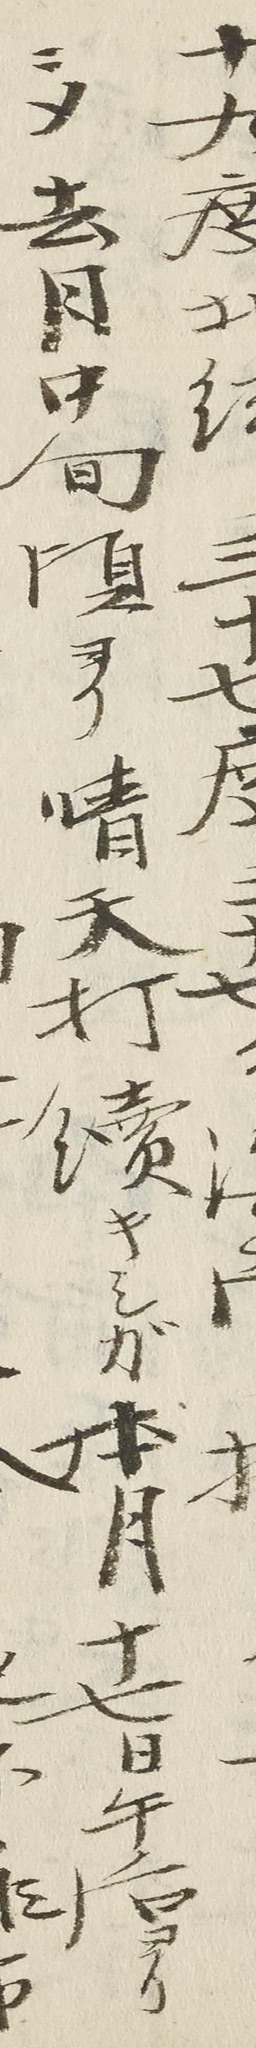二シテ去月中旬頃ヨリ晴天打続キシガ本月十七日午后ヨリ
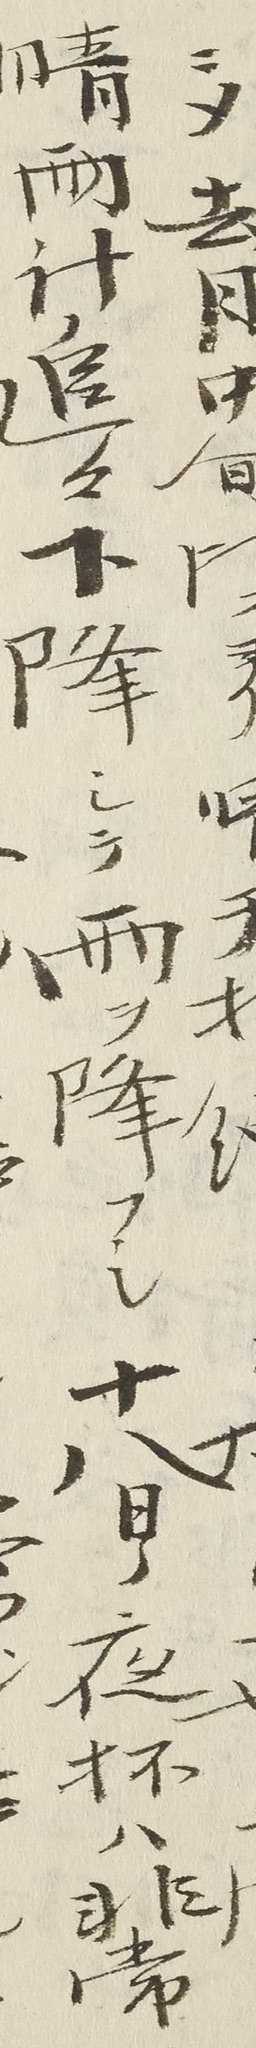晴雨計追々下降シテ雨ヲ降フシ十八日ノ夜抔ハ非常
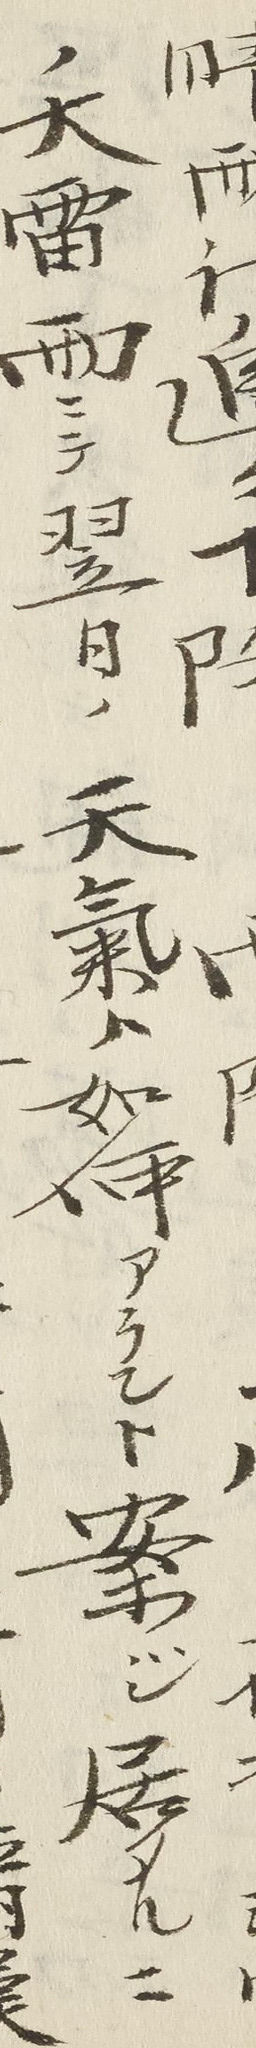ノ大雷雨ニテ翌日ノ天気ハ如何アラント案ジ居タル二
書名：日蝕録　全
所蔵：東京大学地震研究所図書室 Earthquake Research Institute Library, The University of Tokyo, JAPAN
